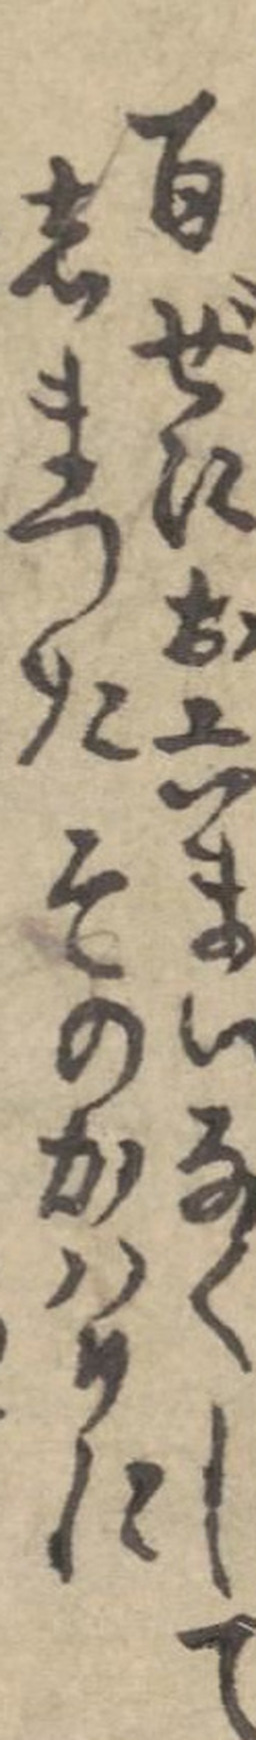しまつたそのかはりに
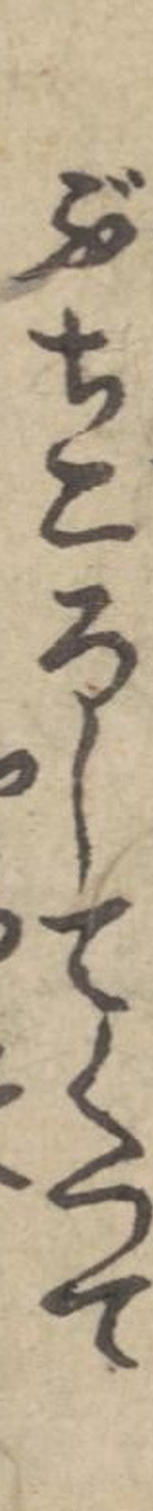ぶちころしてくつて
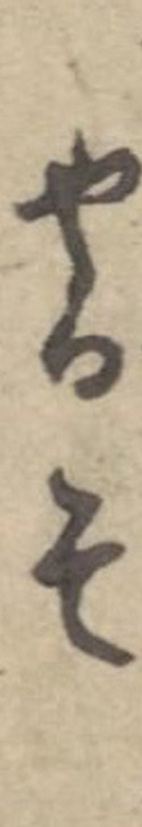やるそ
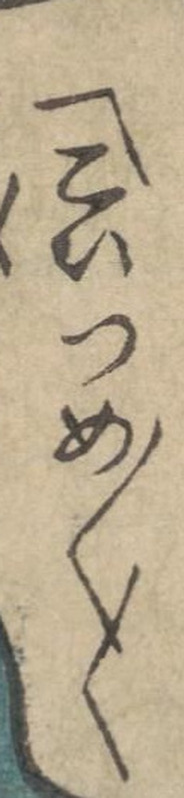〽こいつめ〳〵〳〵
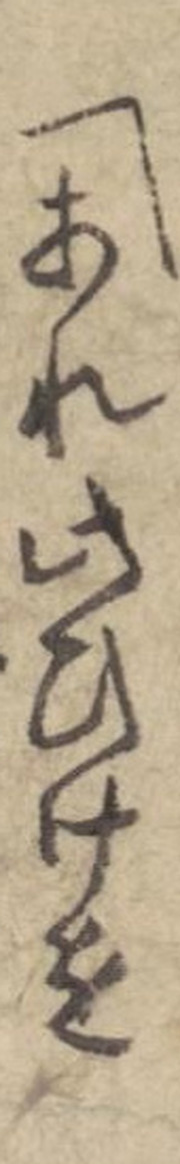〽あれ此ひけを
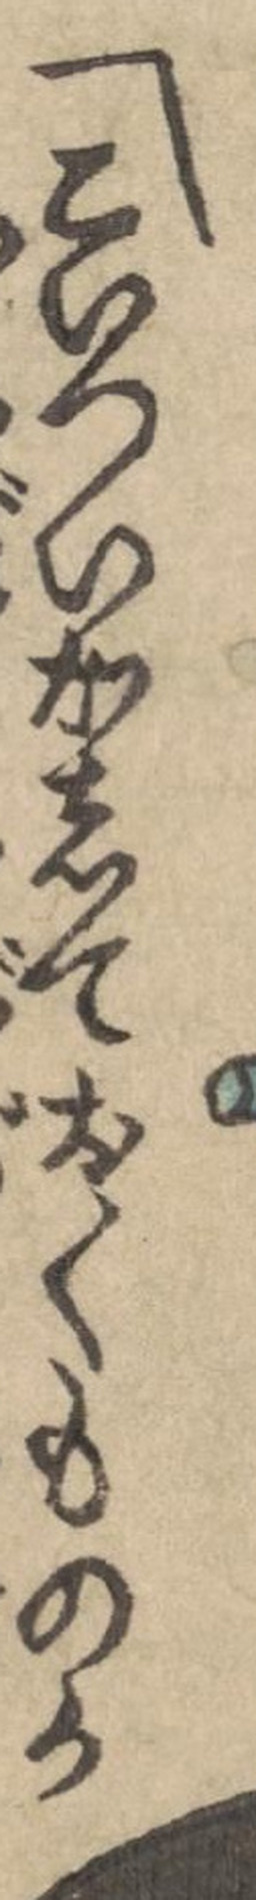〽こいついかしておくものか
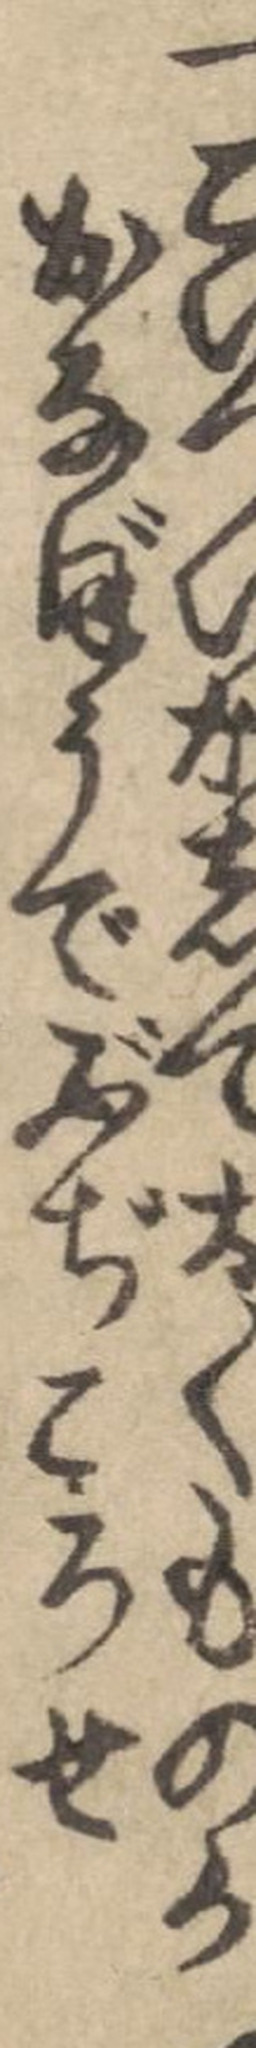かなぼうでぶぢころせ
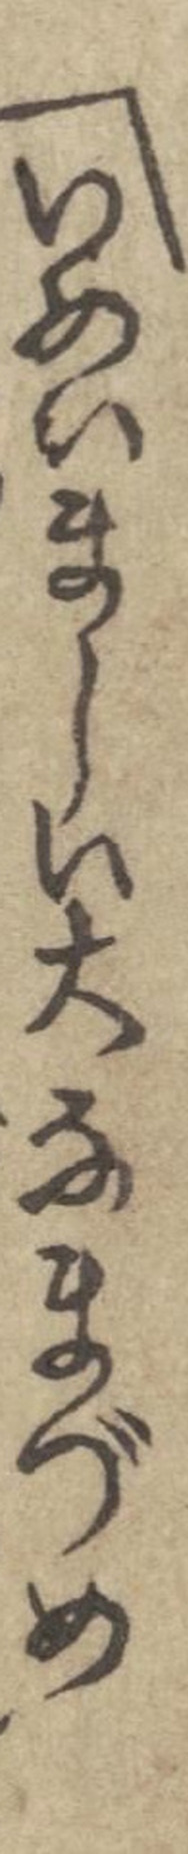〽いめいましい大なまづめ
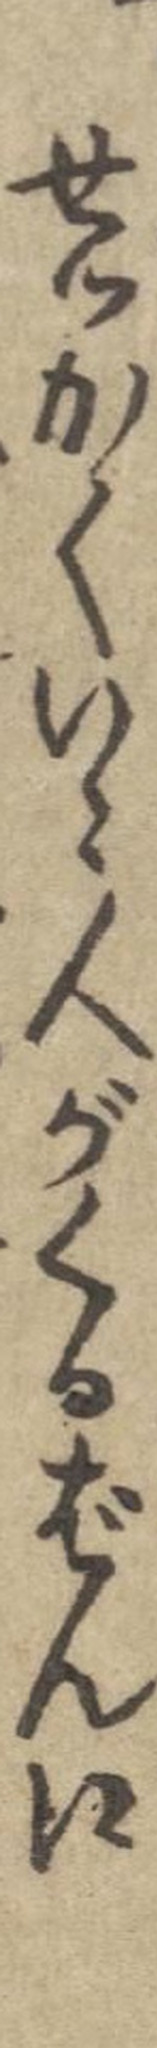せつかくいゝ人がくるばんに
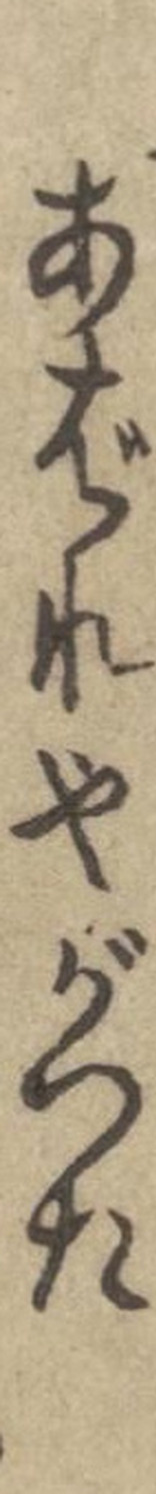あばれやがつた
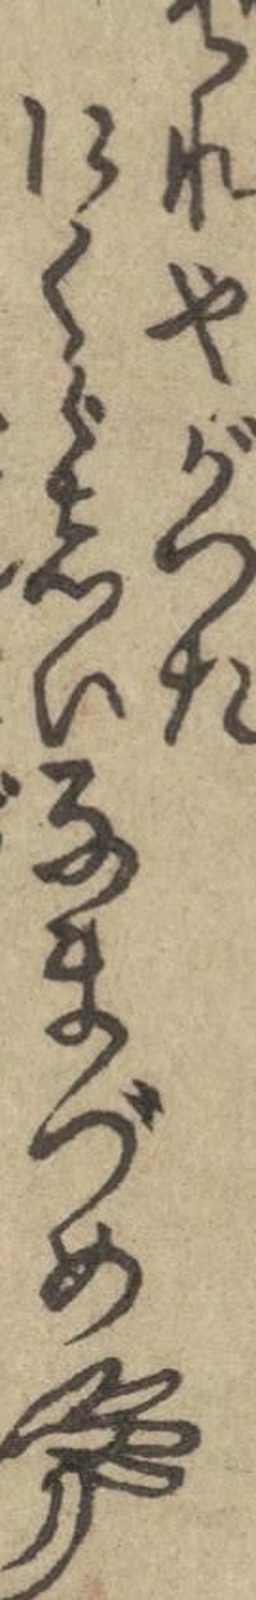にくらしいなまづめ
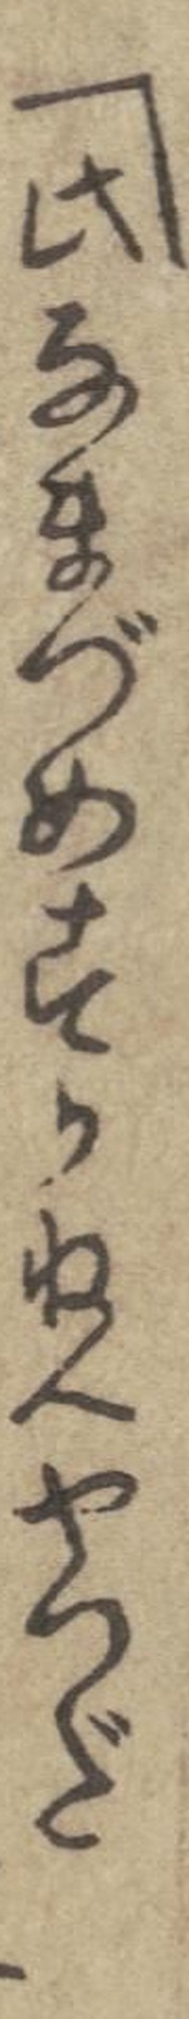〽此なまづめすかねへやつだ
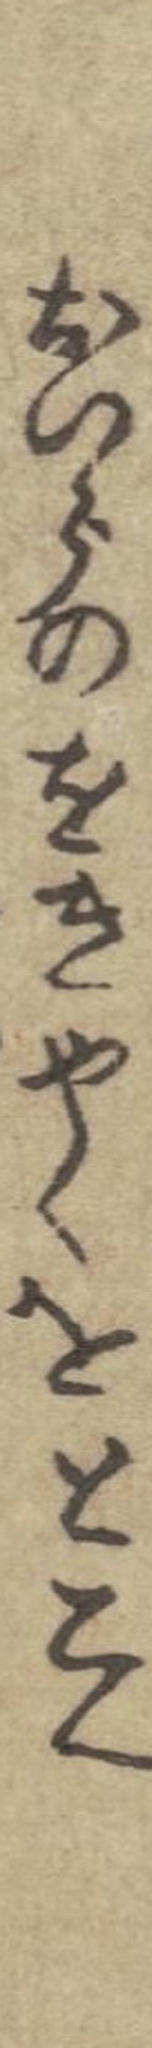おいらのをきやくをとこへ
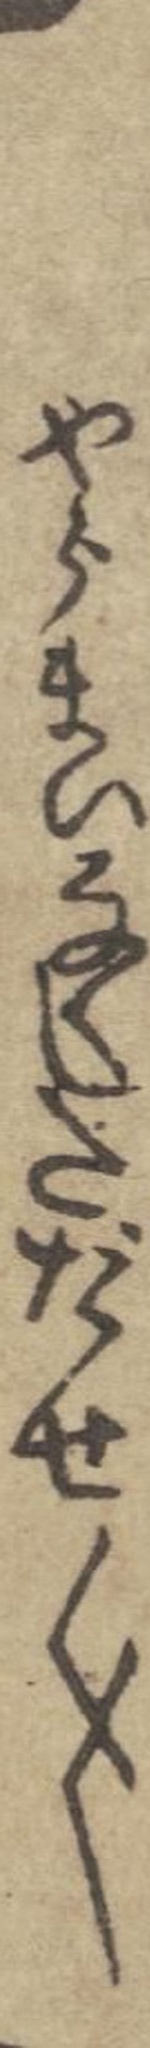やらまいなくしただせ〳〵〳〵
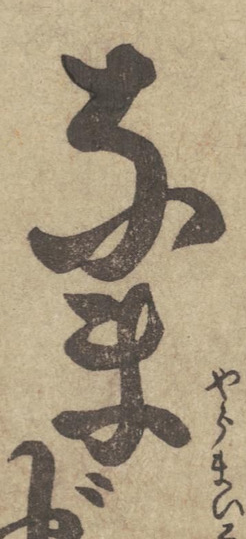なまづ
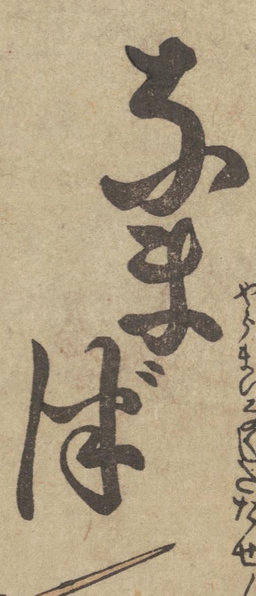なまず
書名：しんよし原大なまづゆらひ
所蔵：東京大学地震研究所図書室 Earthquake Research Institute Library, The University of Tokyo, JAPAN
